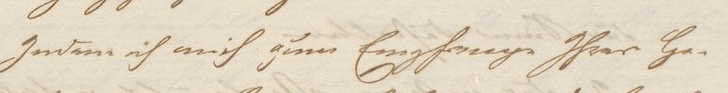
Indem ich mich zum Empfange Ihres Ge-
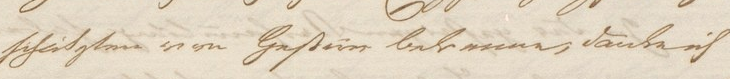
schätzten von Gestern bekenne, danke ich
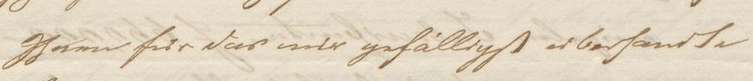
Ihnen für das mir gefälligst übersandte
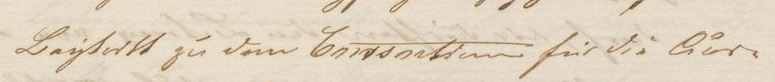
Beytritt zu dem Consortium für die Aus-
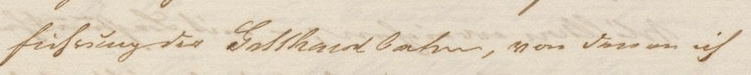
führung der Gotthardbahn, von denen ich
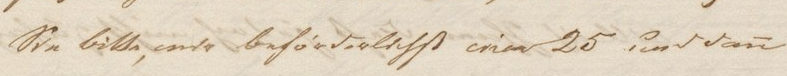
Sie bitte, mir beförderlichst circa 25 und dann
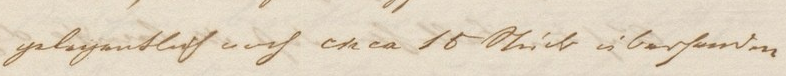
gelegentlich noch circa 15 Stück übersenden
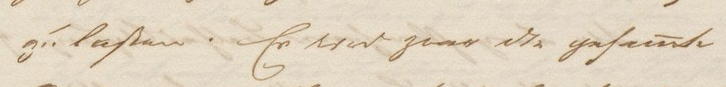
zu laßen. Es wird zwar die gesammte
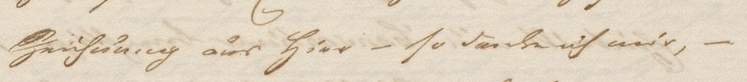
Zeichnung aus Hier – so denke ich mir, –
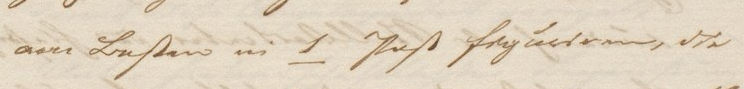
am Besten in 1 Paß figuriren, die
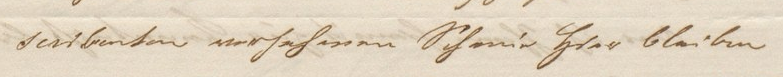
scribenten versehenen Scheine Hier bleiben
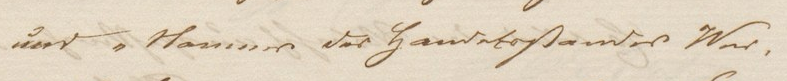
und «Namens des Handelsstandes Win-
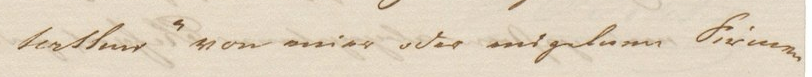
terthur » von einer oder einzelnen Firmen
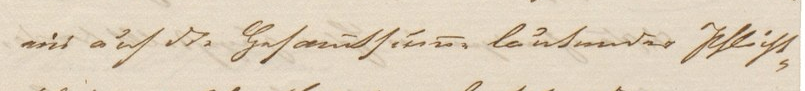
mit auf die Gesammtsumme lautender Pflicht-
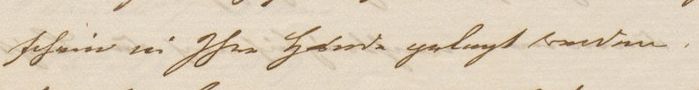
schein in Ihre Hände gelegt werden.
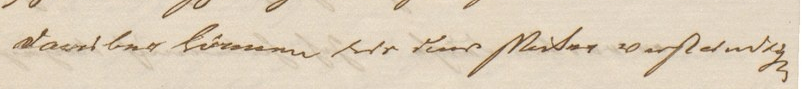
Darüber können wir uns später verständigen.
